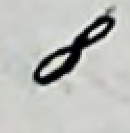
8
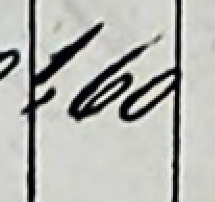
1,60
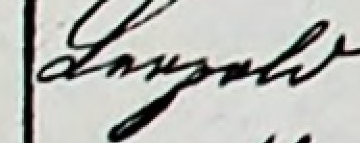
Leopold
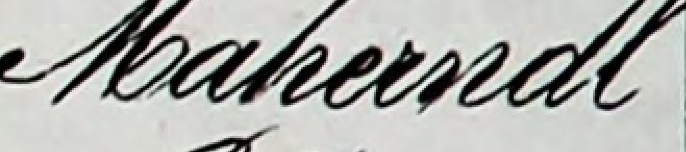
Maherndl
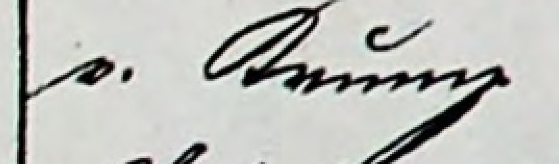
v. Krung
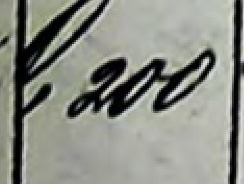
0,200
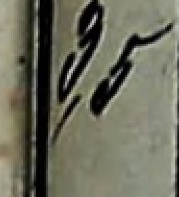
3,5
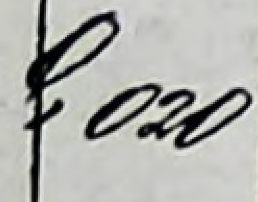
0,020
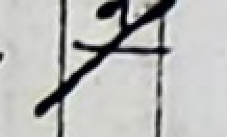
7
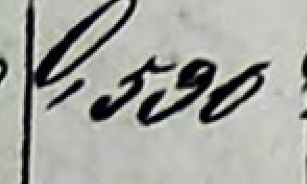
0,530
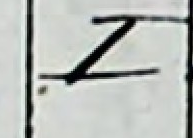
I
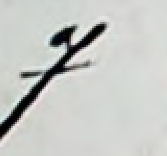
7
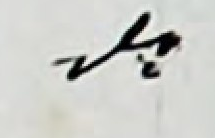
do
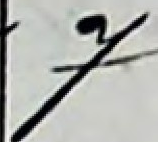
7
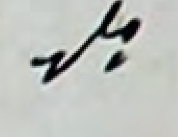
do
